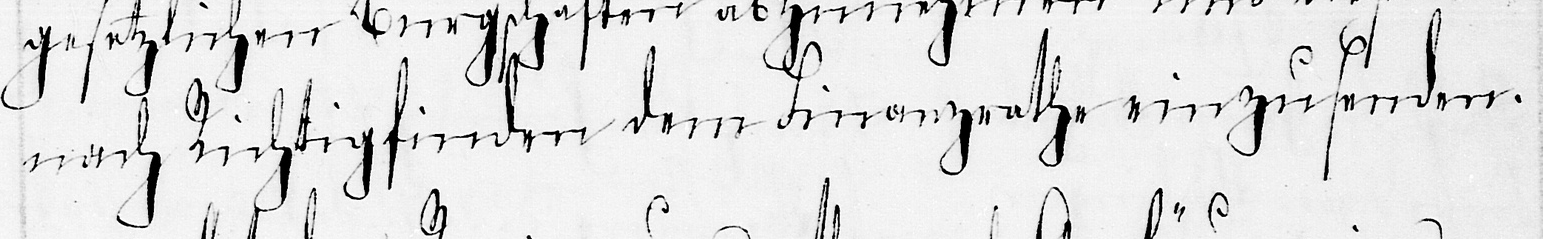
nach Richtigfinden dem Finanzrathe einzusenden.
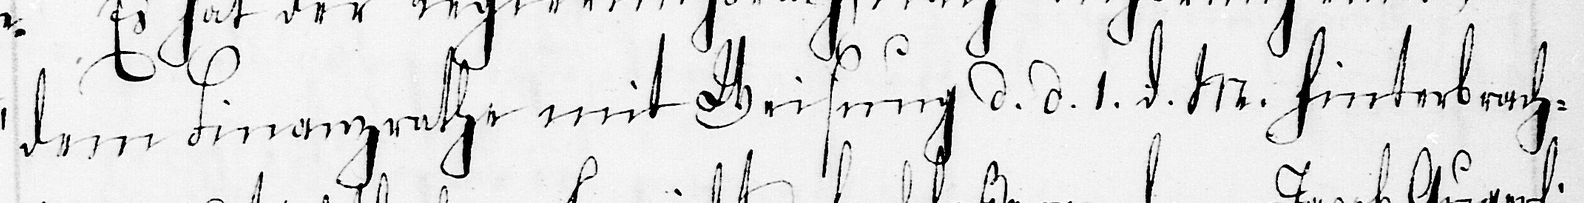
dem Finanzrathe mit Weisung d. d. 1. d. M. hinterbrach¬
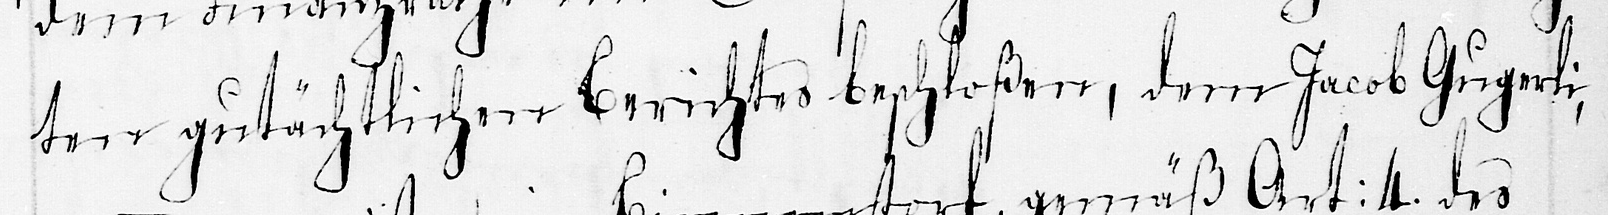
ten gutächtlichen Berichtes beschloßen, dem Jacob Gugerli,
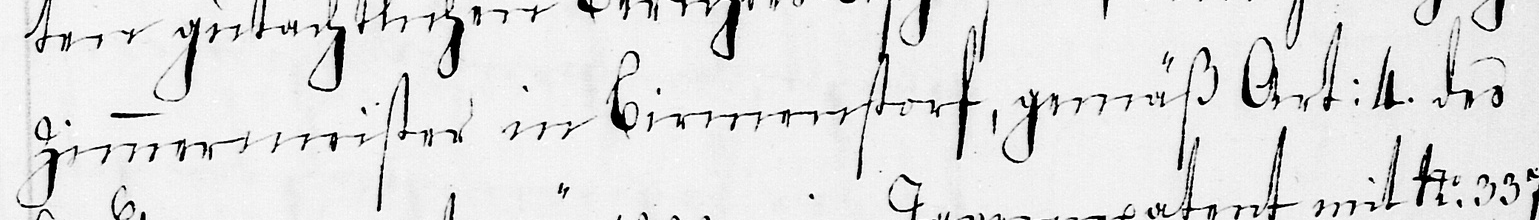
Zimmermeister in Birmenstorf, gemäß Art: 4. des
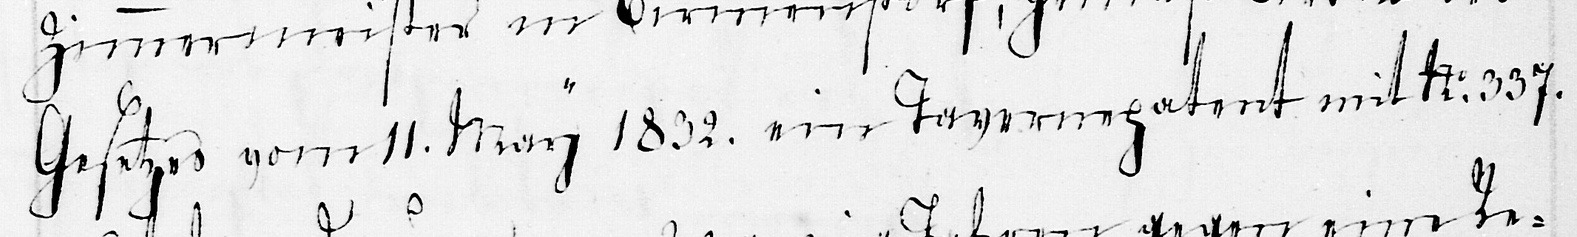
Gesetzes vom 11. May 1832. ein Tavernepatent mit No. 337.
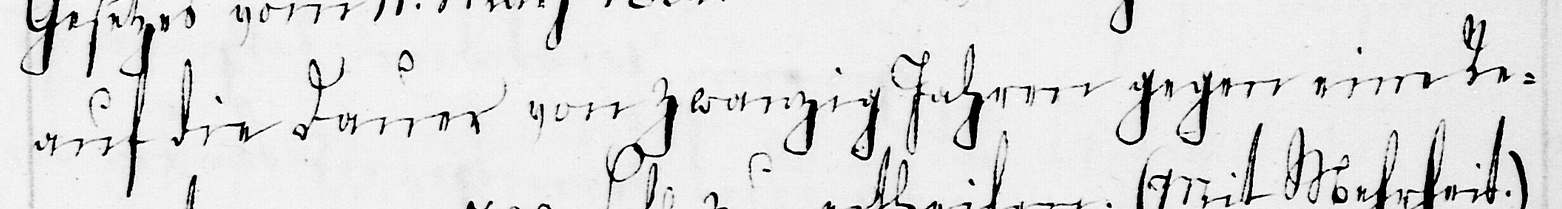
auf die Dauer von zwanzig Jahren gegen eine Re¬
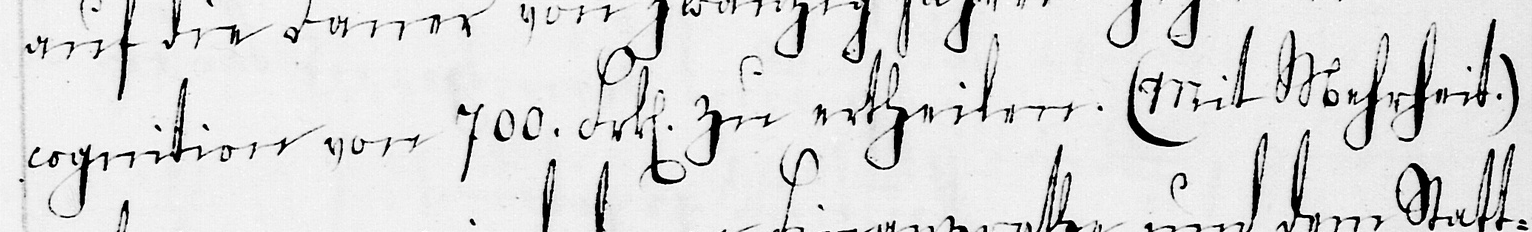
cognition von 700. Frk[en]. zu ertheilen. (Mit Mehrheit.)
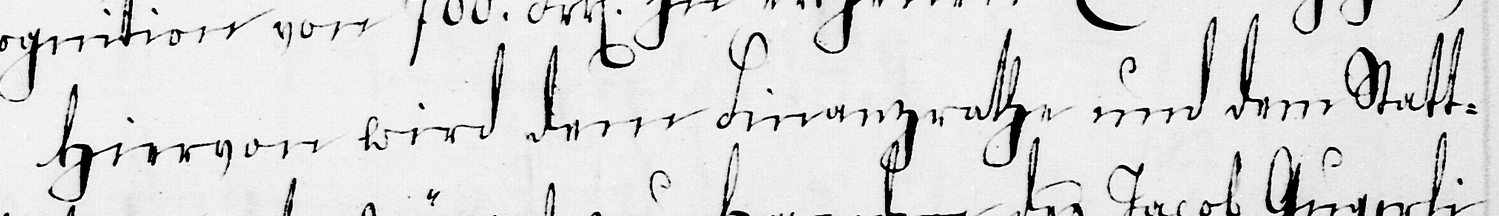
Hiervon wird dem Finanzrathe und dem Statt¬
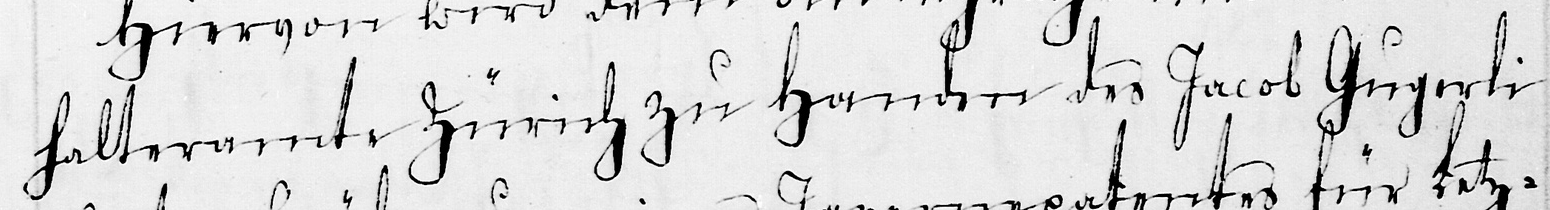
halteramte Zürich zu Handen des Jacob Gugerli
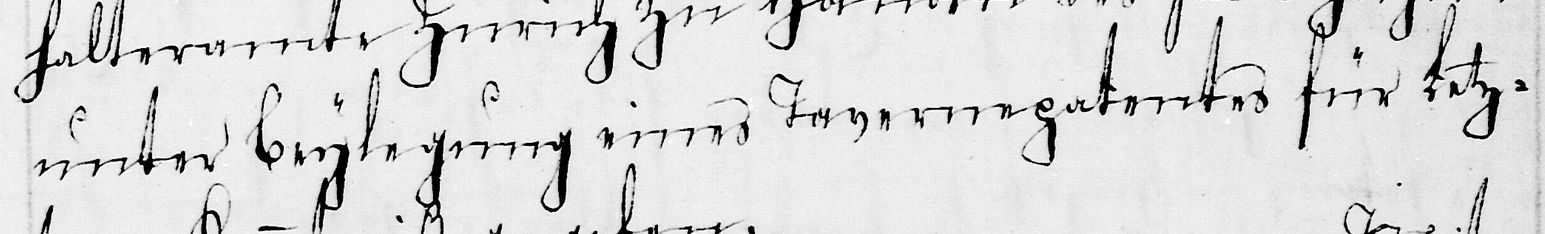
unter Beylegung eines Tavernepatentes für Letz¬
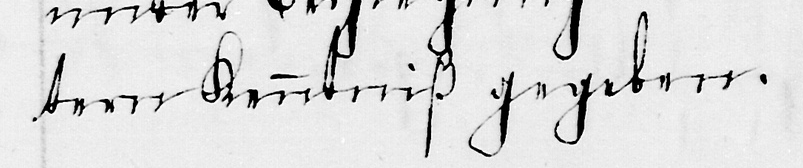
tern Kenntniß gegeben.
